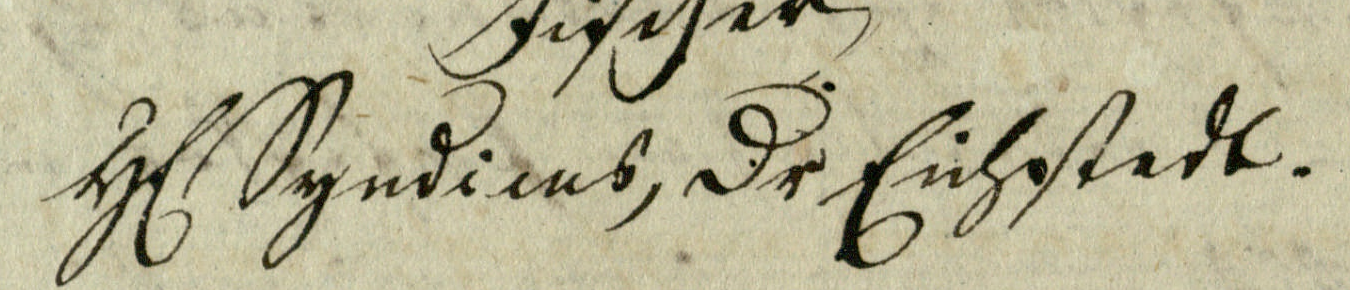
HE Syndicus, Dr Eichstedt.
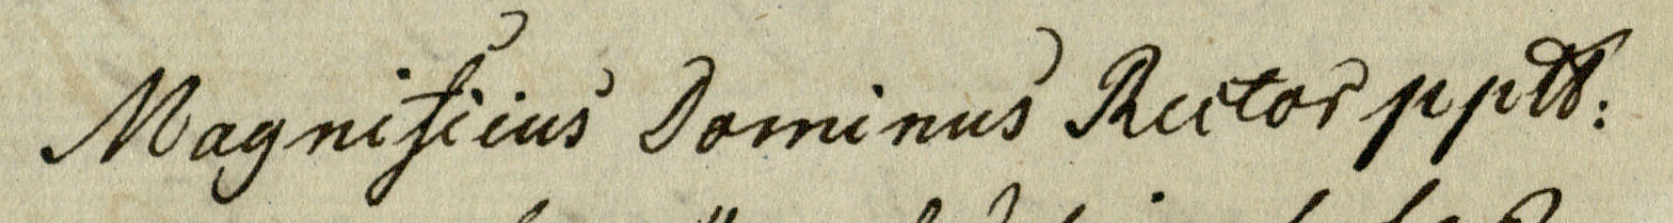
Magnificus Dominus Rector pp tt:
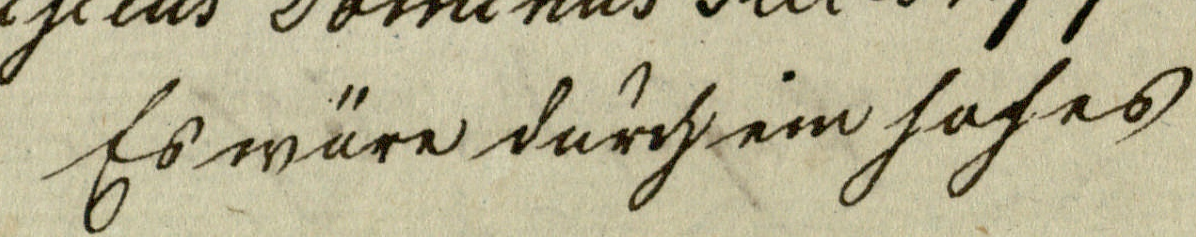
Es wäre durch ein hohes
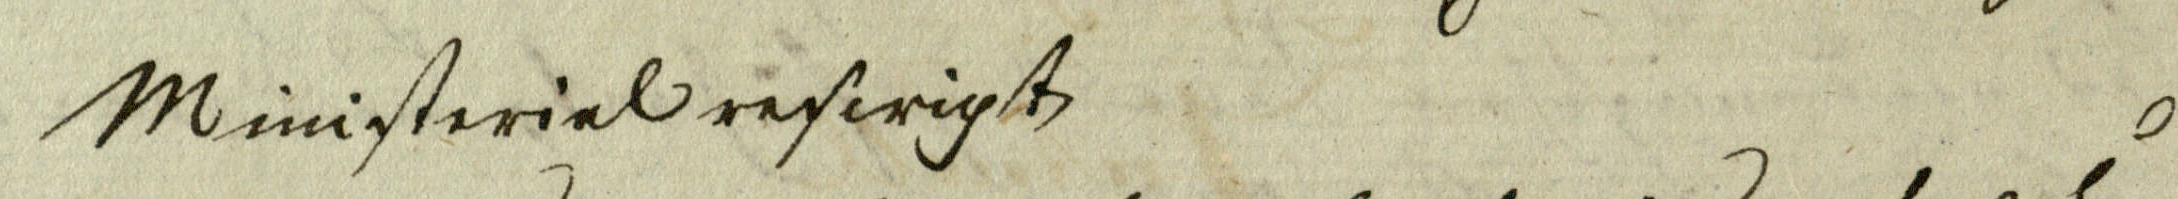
Minsterialrescript
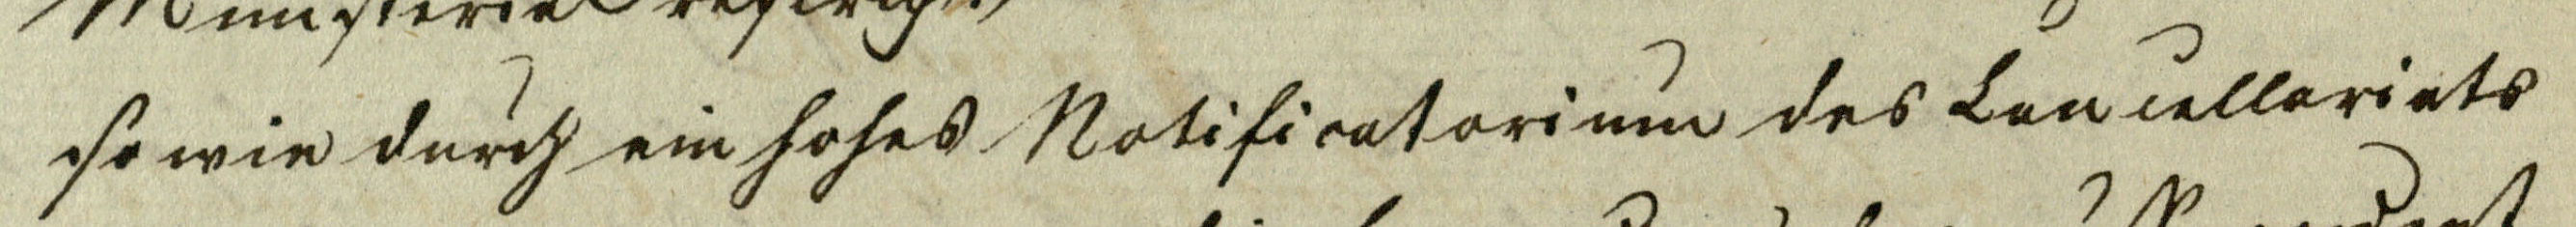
sowie durch ein hohes Notificatorium des Cancellariats
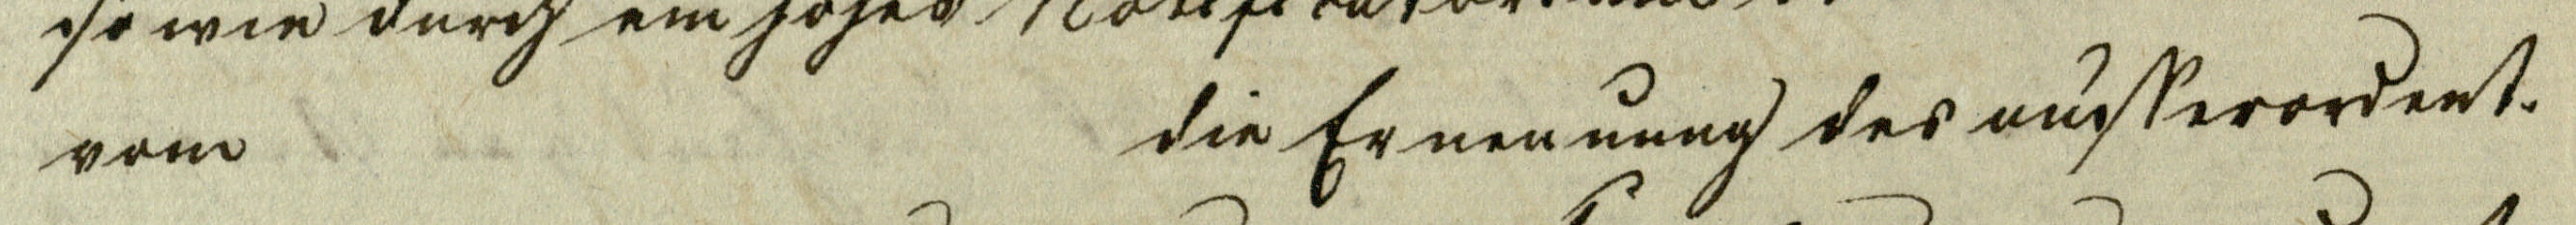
vom die Ernennung des außerordent¬
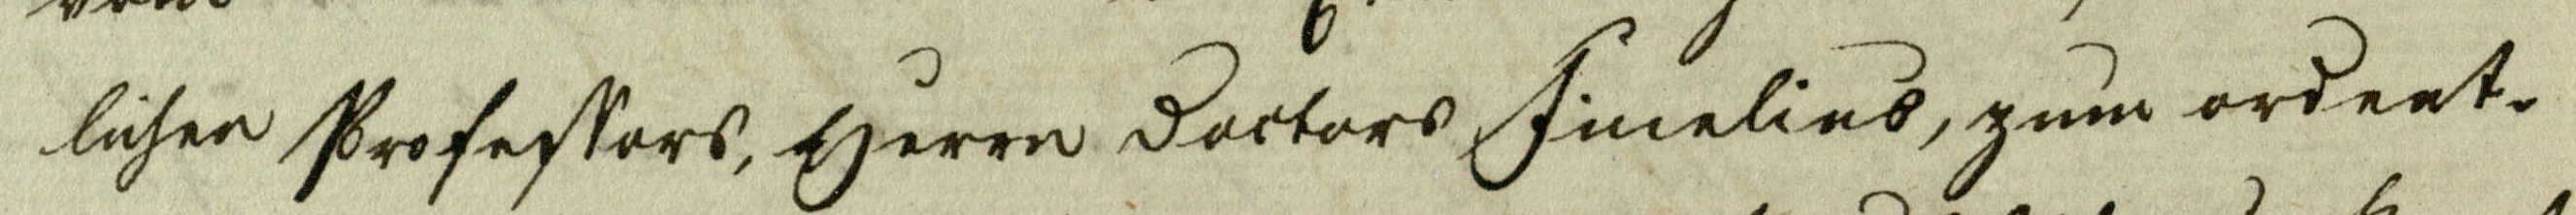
lichen Professors, Herrn Doctors Finelius, zum ordent¬
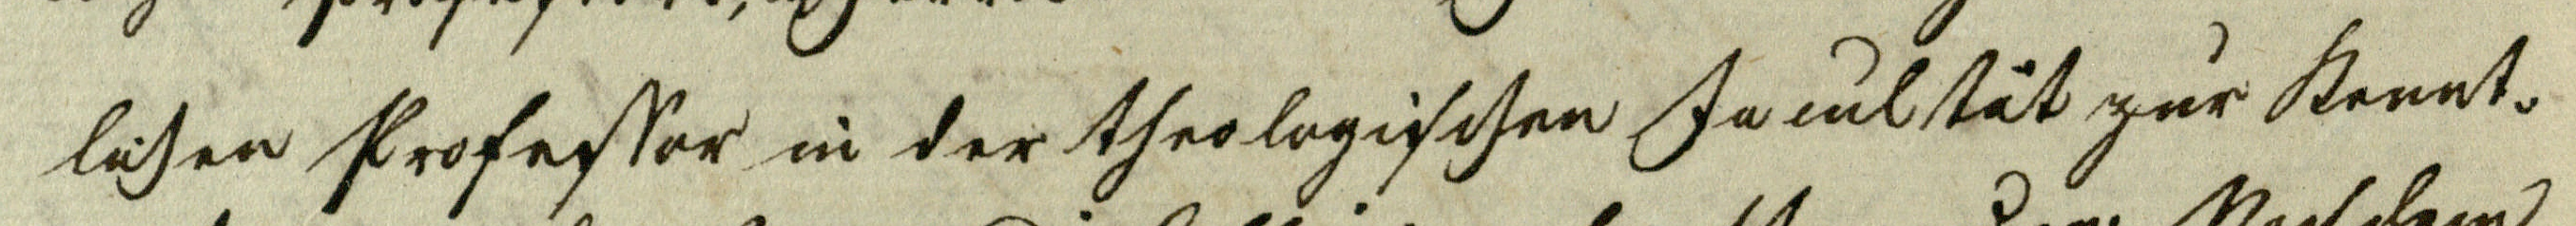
lichen Professor in der theologischen Facultät zur Kennt¬
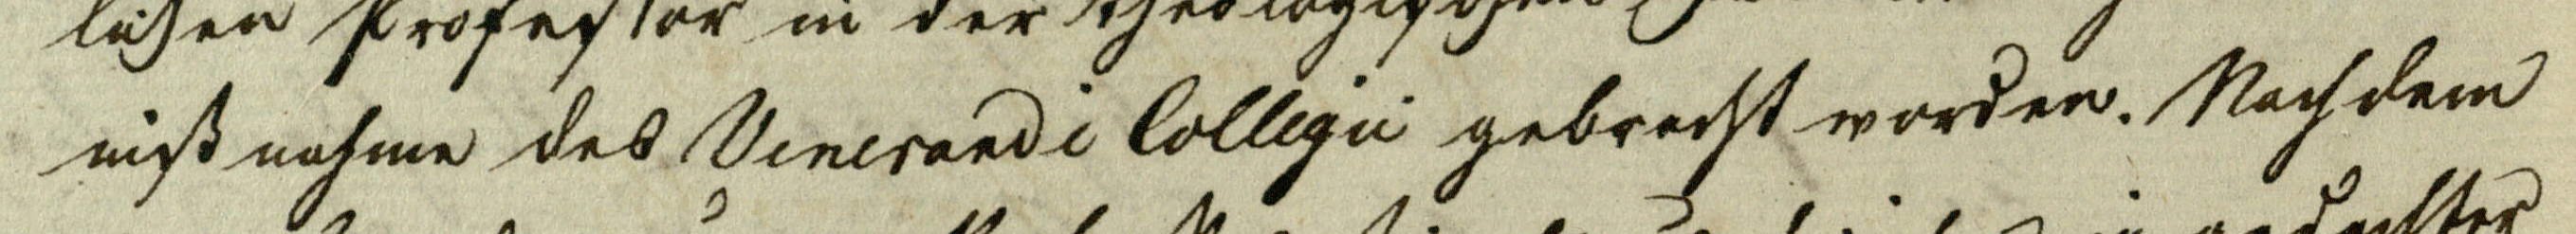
nisnahme des Venerandi Collegii gebracht worden. Nachdem
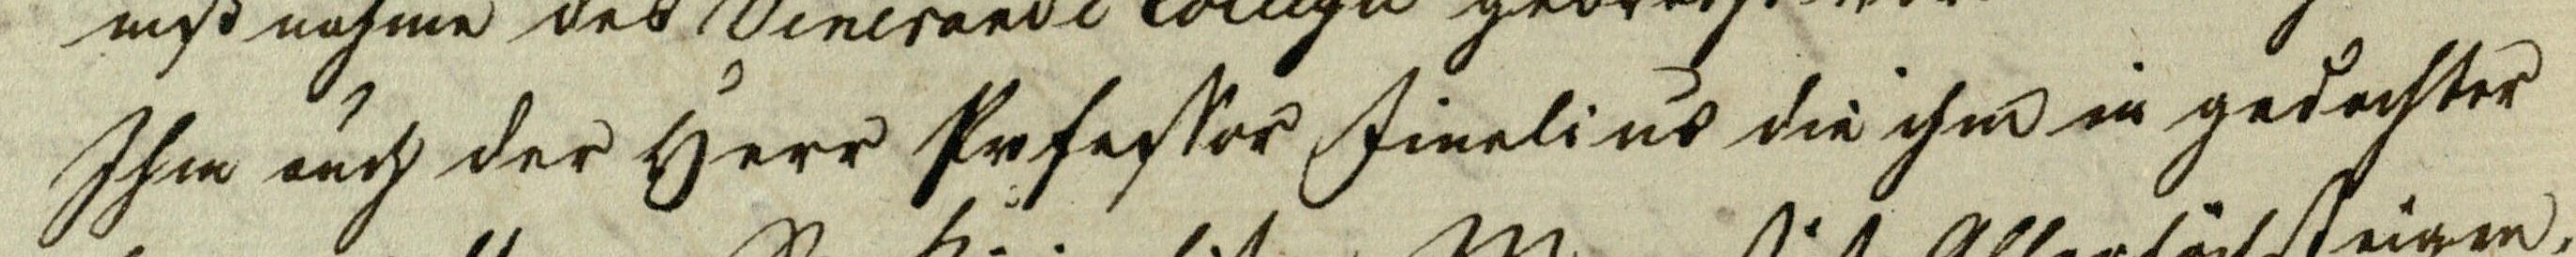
Ihm auch der Herr Professor Finelius die ihm in gedachter
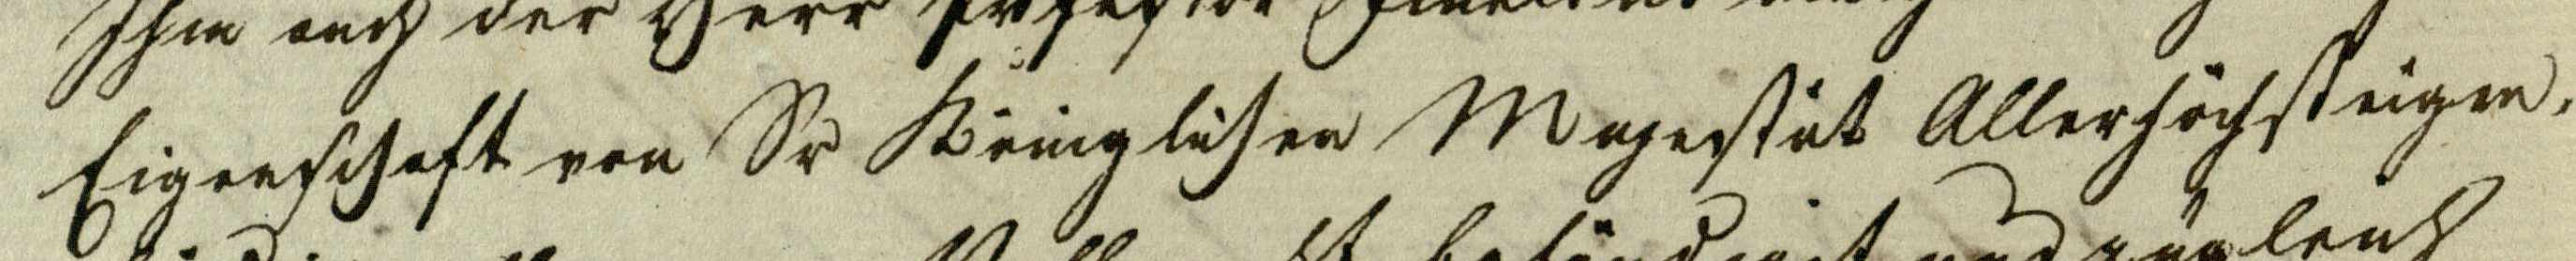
Eigenschaft von Sr Königlichen Majestät Allerhöchsteigen¬
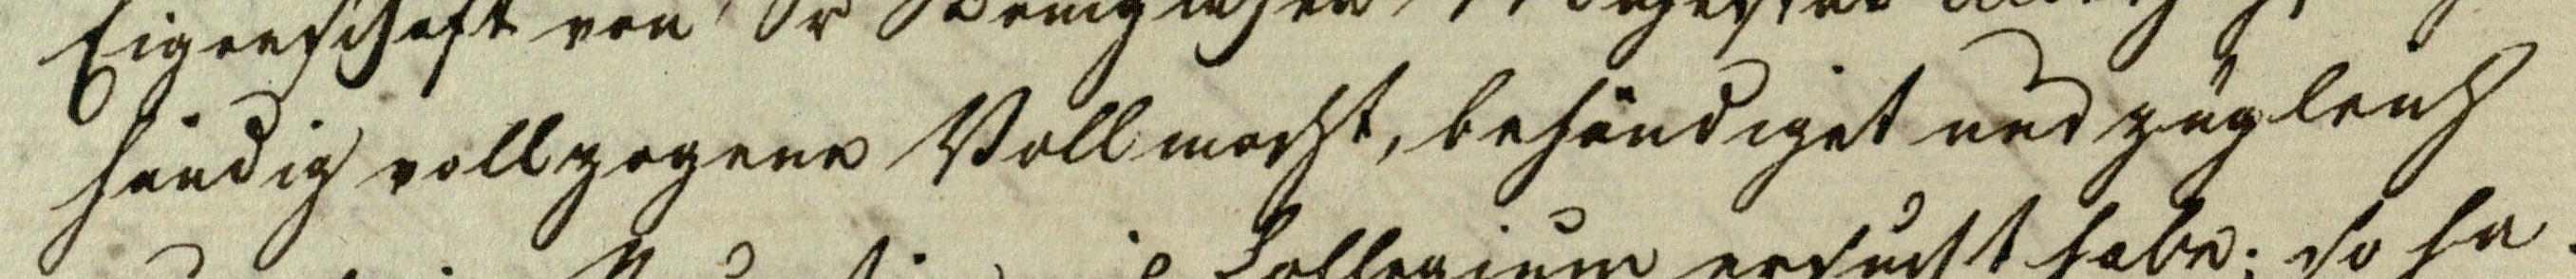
ständig vollzogenen Vollmacht, behändiget und zugleich
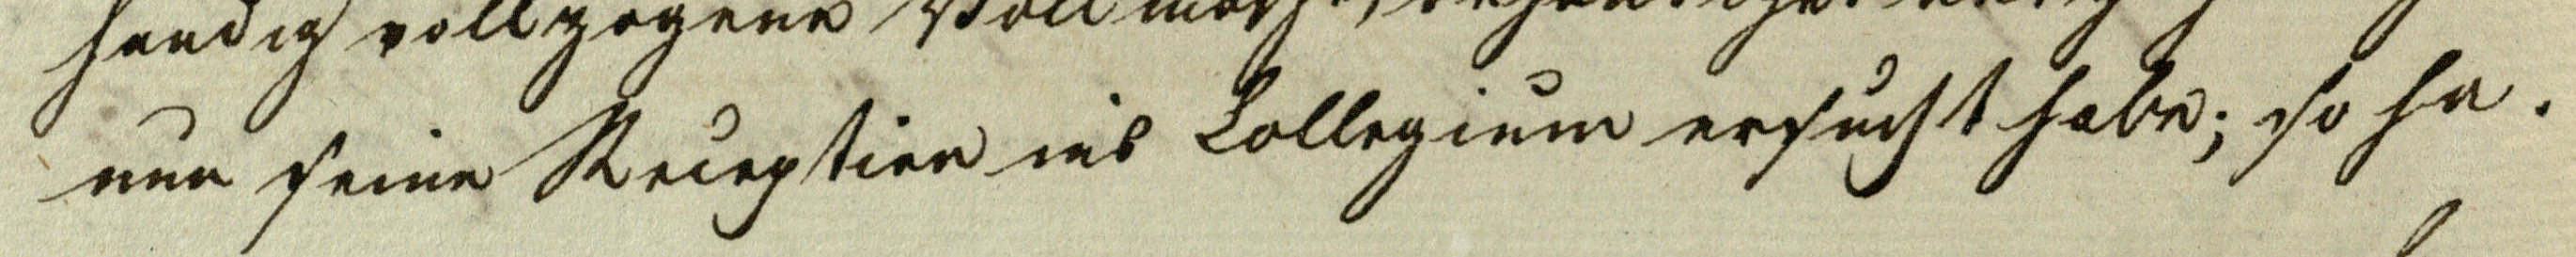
nun seine Reception ins Collegium ersucht habe; so ha¬
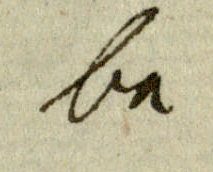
be
